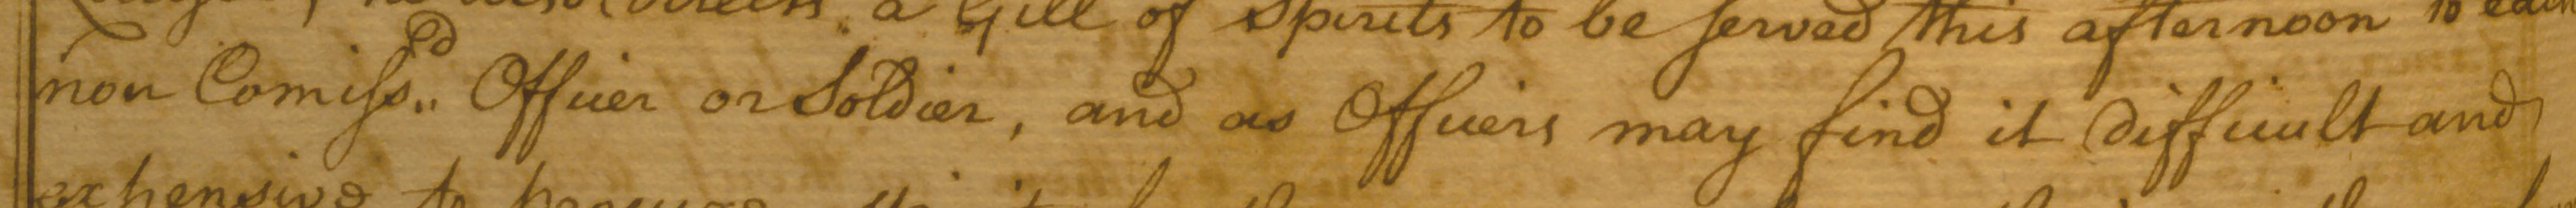non Comiss^d. Officer or Soldier, and as Officers may find it difficult and
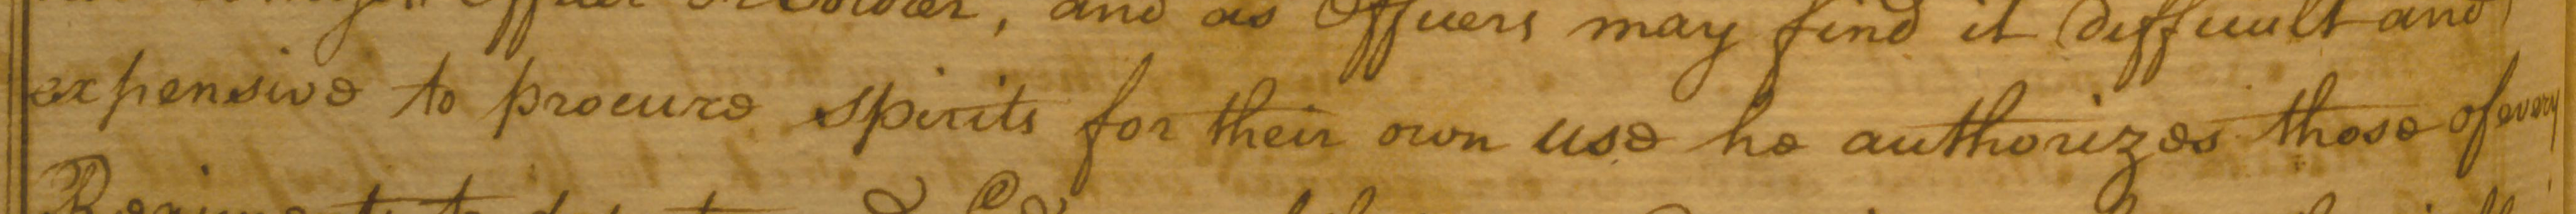expensive to procure spirits for their own use he authorizes those of every
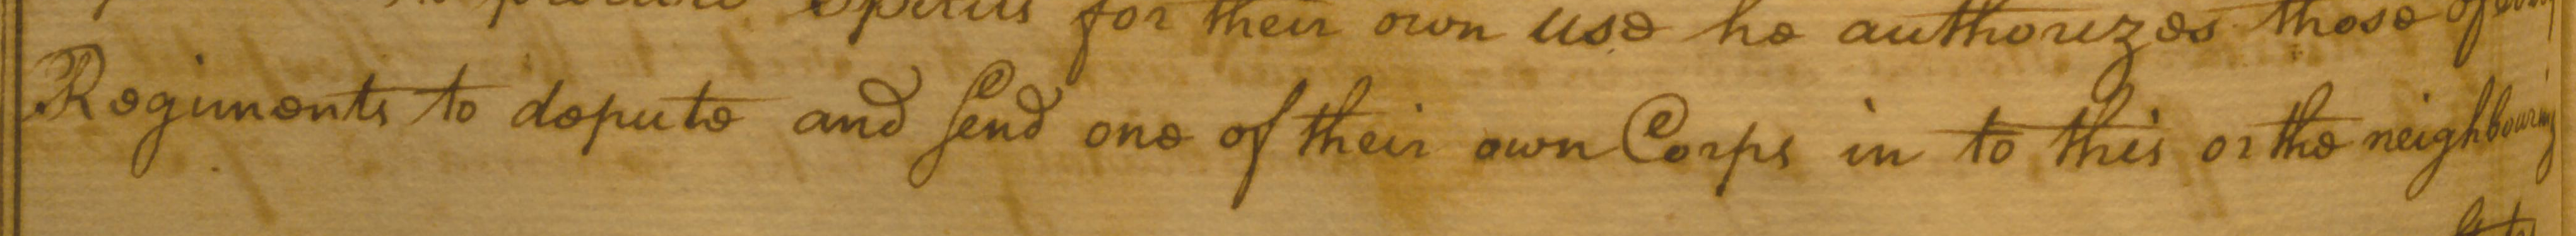Regiment to depute and send one of their own Corps in to this or the neighboring
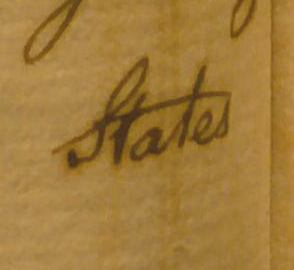States
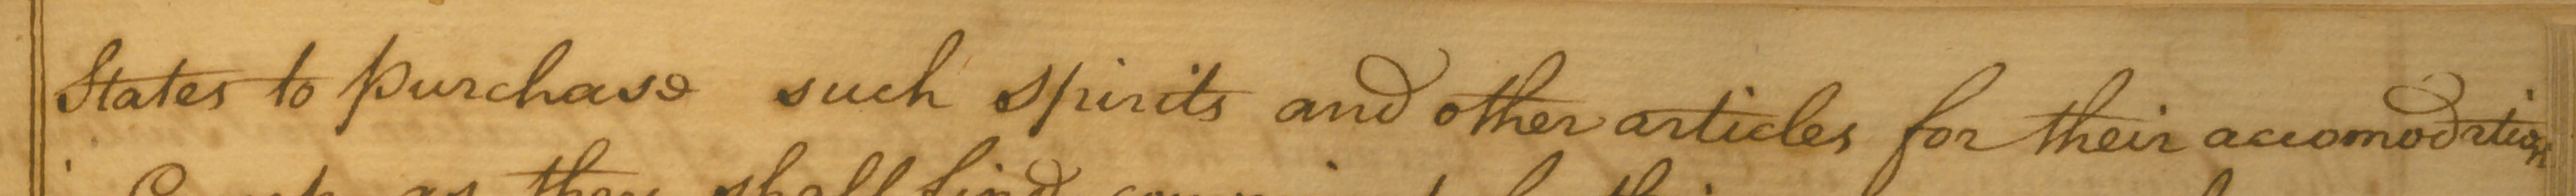States to purchase such spirits and other articles for their accomodation
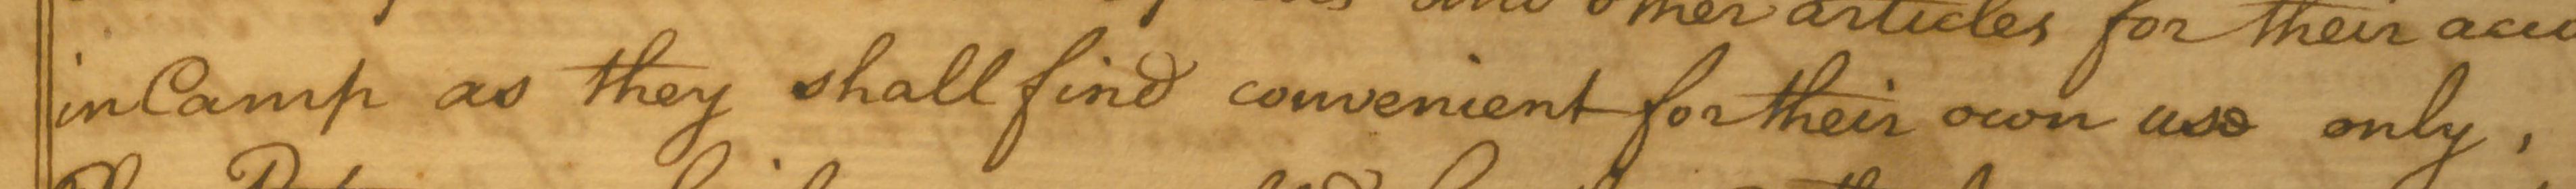in Camp as they shall find convenient for their own use only,
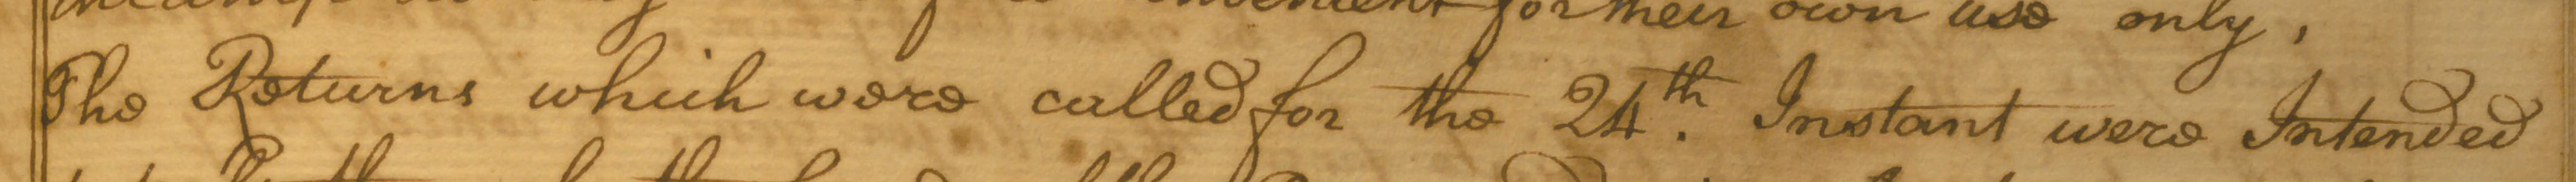The Returns which were called for the 24^th. Instant were Intended
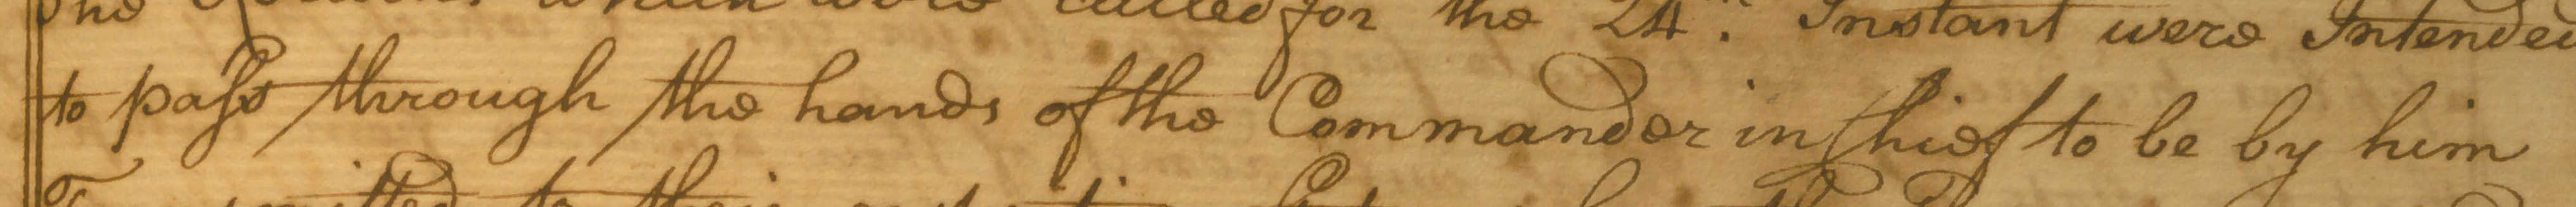to pass through the hands of the Commander in Chief to be by him
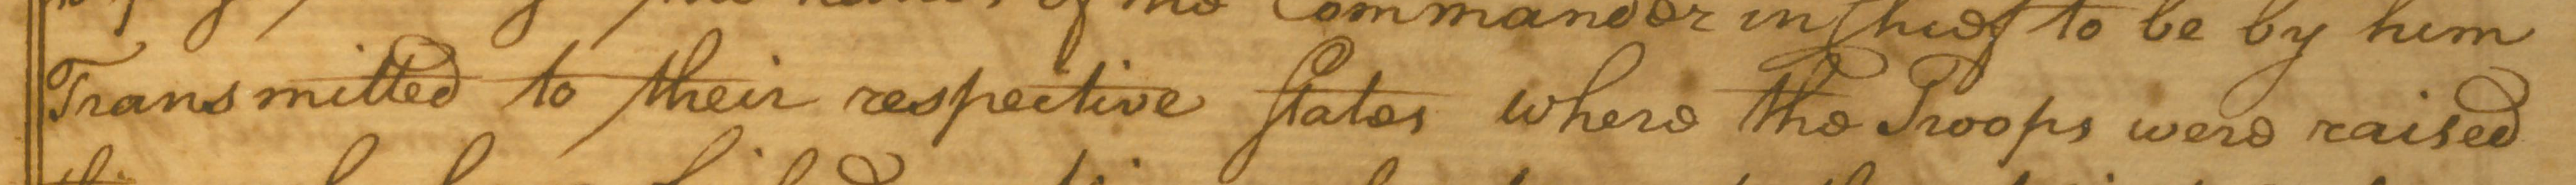Transmitted to their respective States where the Troops were raised
